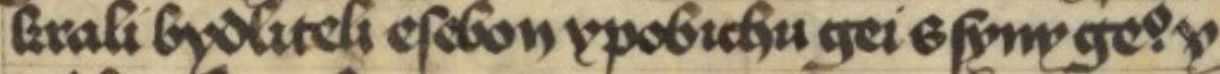krali bydliteli eſebon ypobichu gei sſyny ge.° y
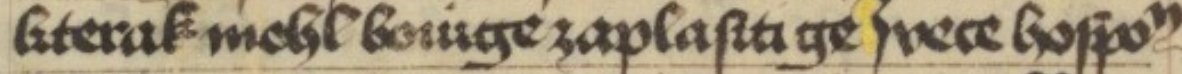kterak mohl boiuge zaplaſiti ge Ivece hoſpon
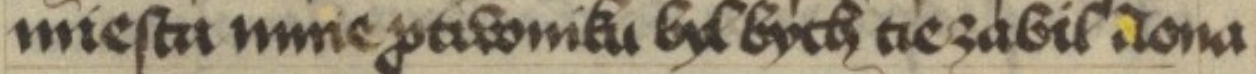mieſta mnie ꝓtiwniku byl bych tie zabil Aona
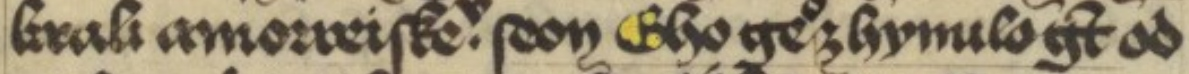krali amorreiſke.v ſeon Gho ge° zhynulo g̑t od
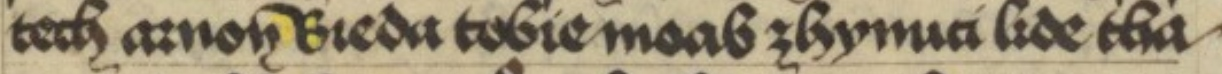tech arnon Bieda tobie moab zhynuci lide tha-
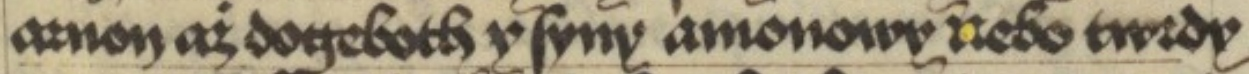arnon aż dogeboth y ſyny amonowy Nebo twrdy-
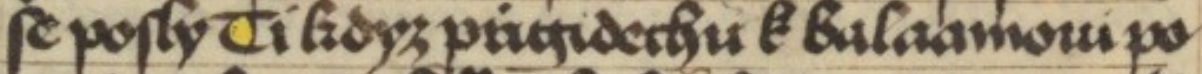ẛe poſly Ti kdyz pṙigidechu k balaamoui po-
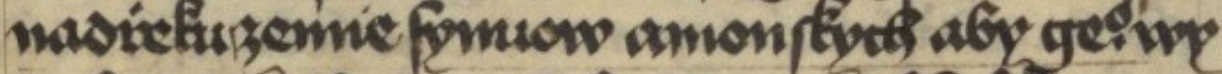nadṙeku zemie ſynuow amonſkych aby ge.° wy-
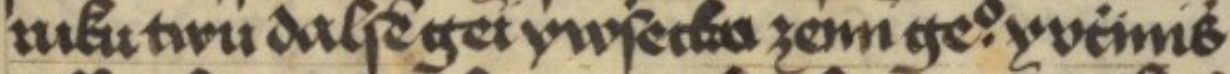ruku twu dalſȇ gei ywẛecko zemi ge.° y vċiniṡ
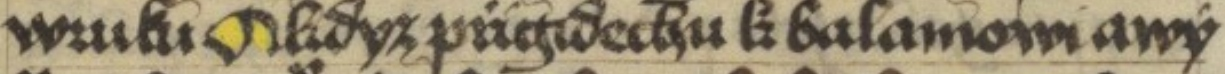wruku Akdyz pṙigidechu k balamowi awy
